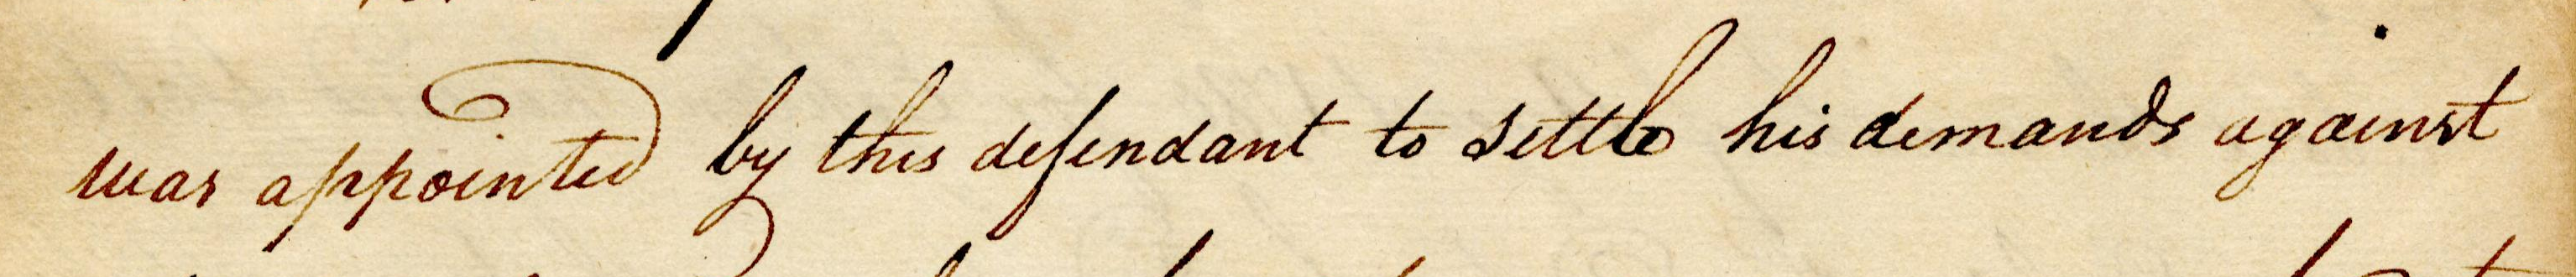was appointed by this defendant to settle his demands against
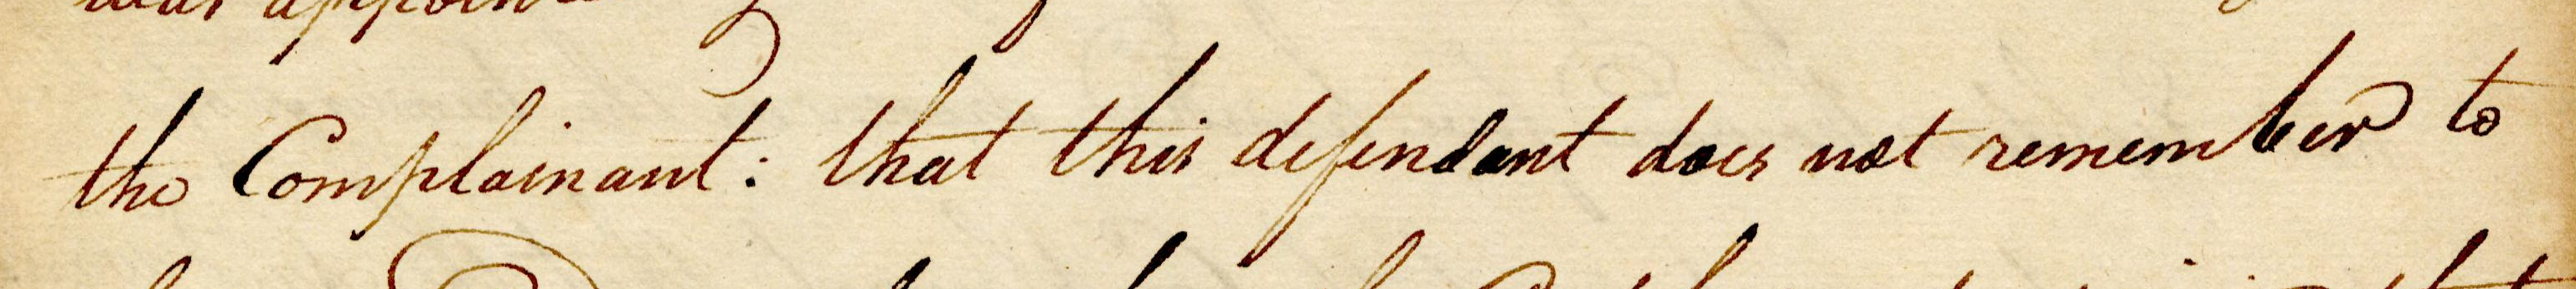the Complainant: that this defendant does not remember to
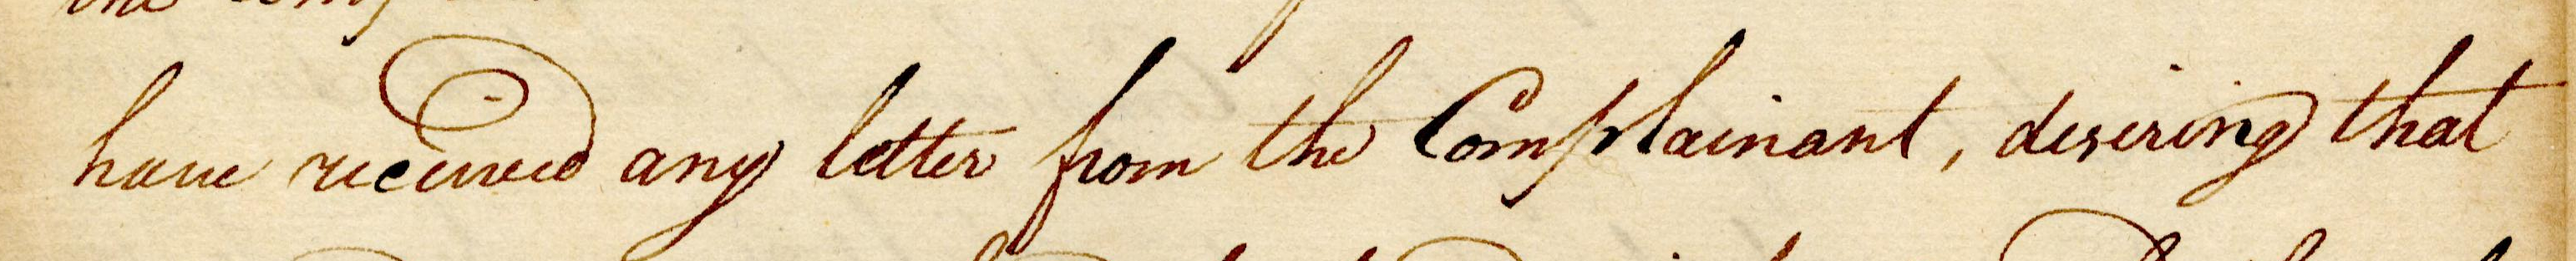have received any letter from the Complainant, desiring that
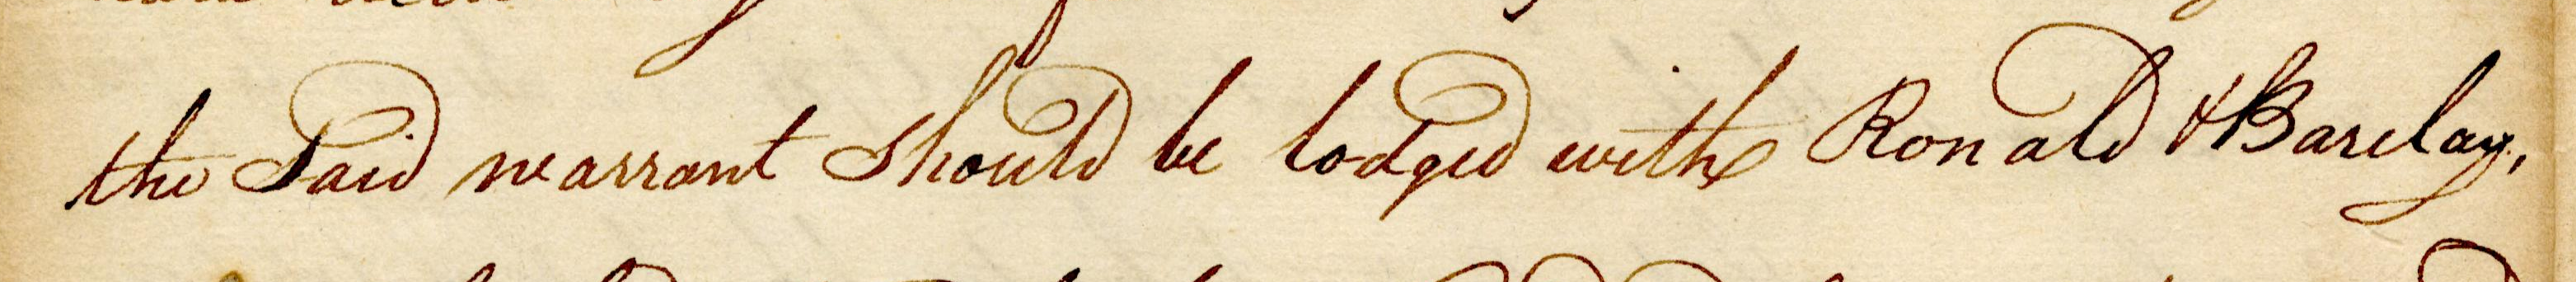the said warrant should be lodged with Ronald^ Barclay.
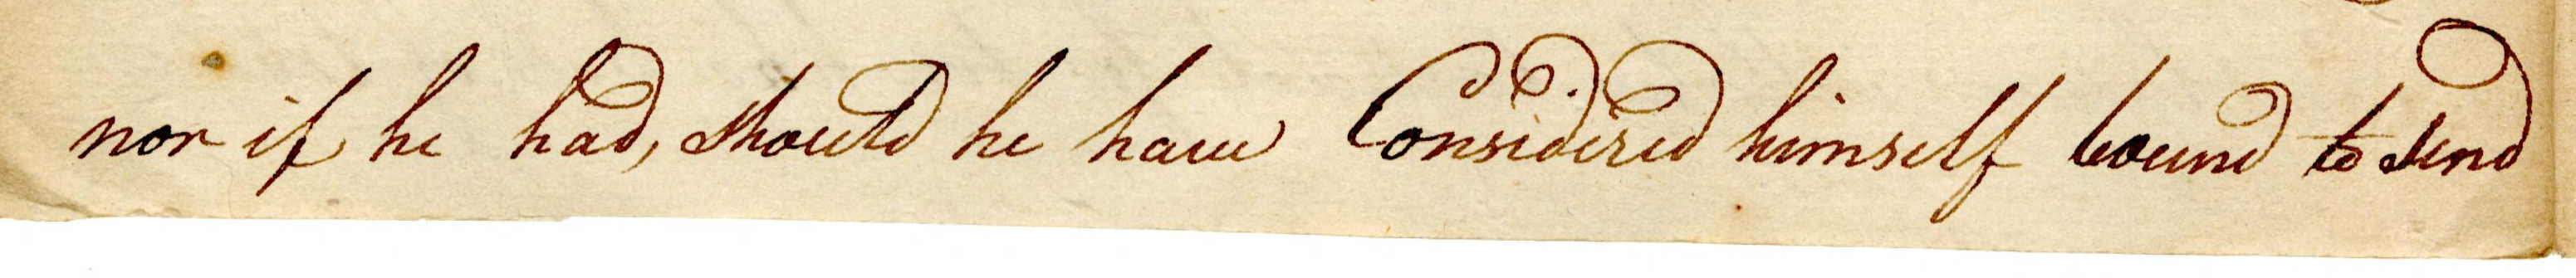nor if he had should he have Considered himself bound to send
